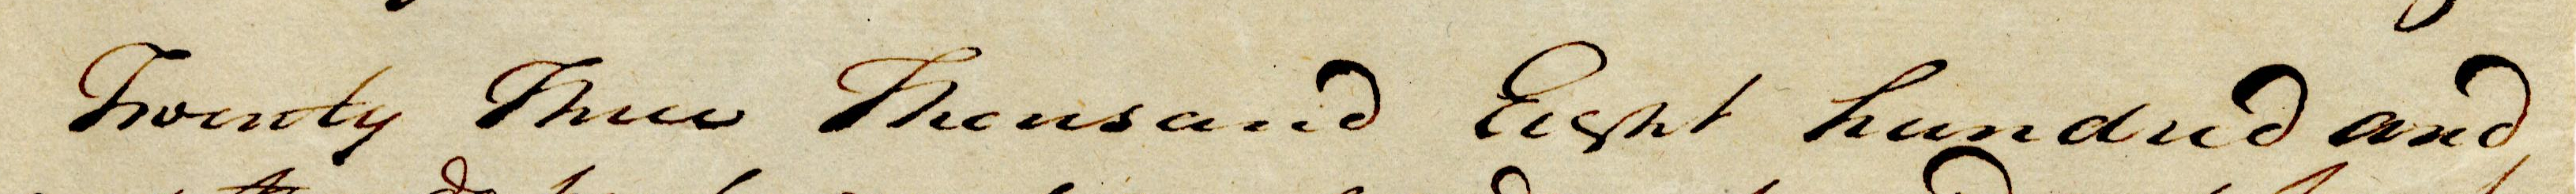Forty Three thousand Eight hundred and
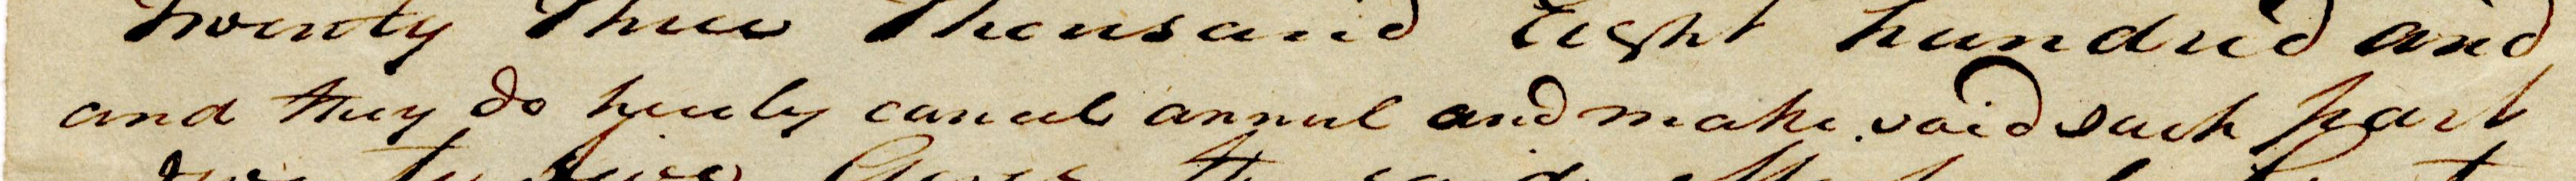and they do here by cancel annul and make said such pact
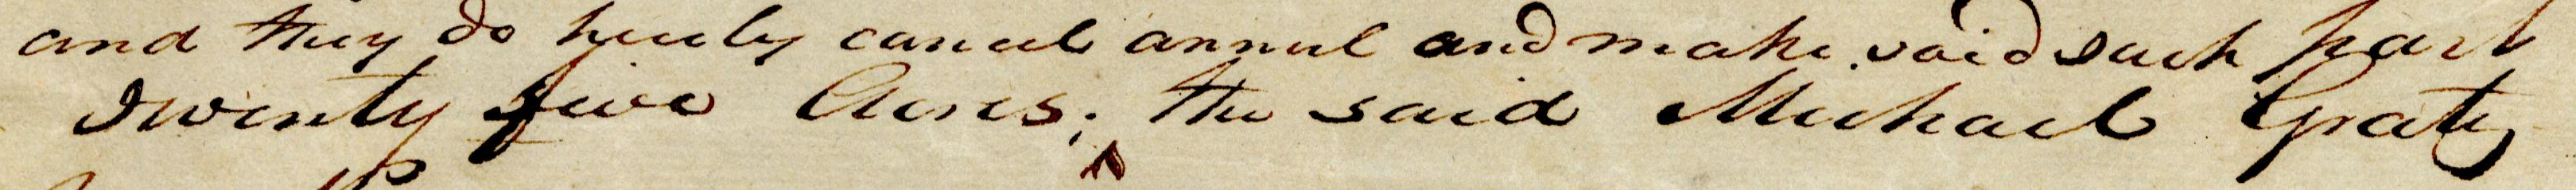Twenty five acres; the said Michael Gratz
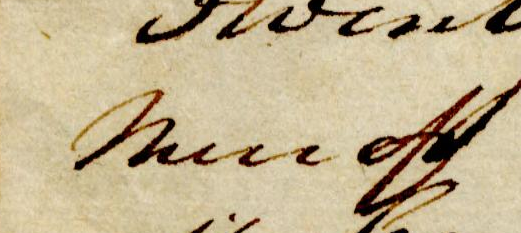there of
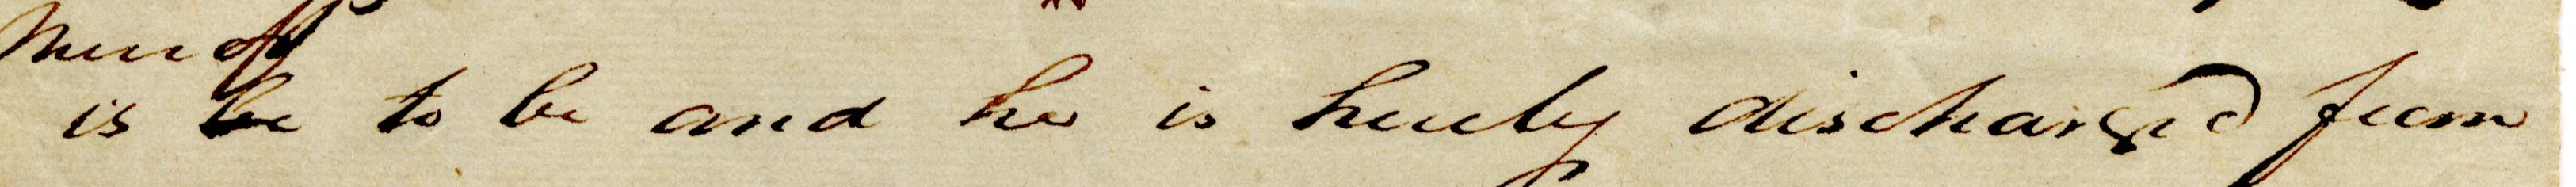is be to be and he is hereby discharged from
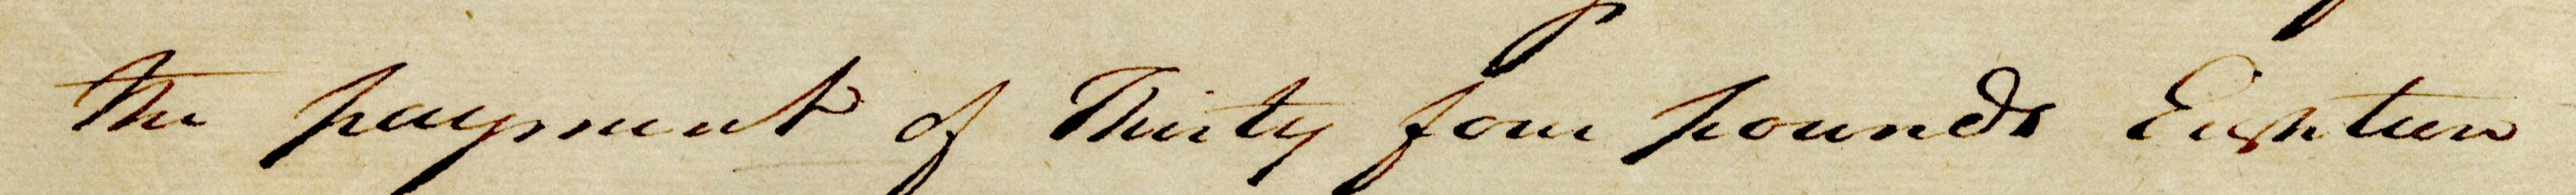the payment of thirty four pounds Eighteen
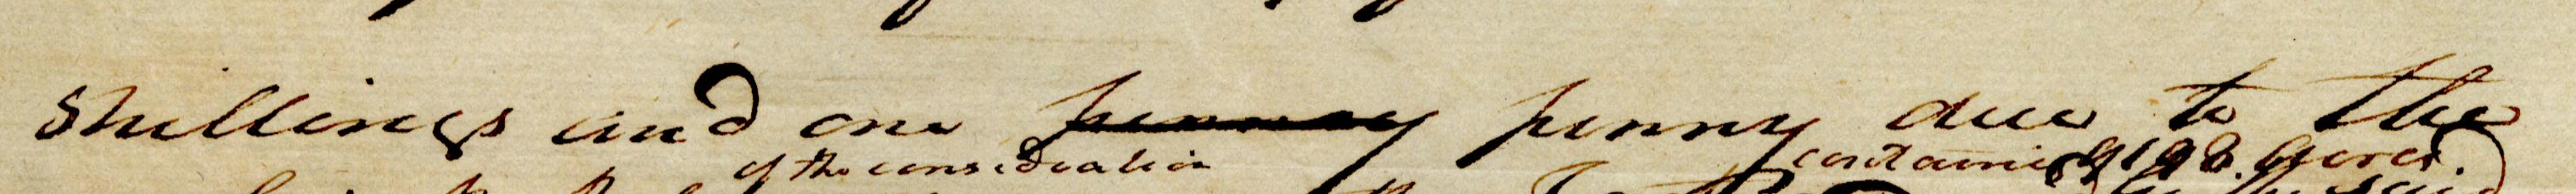shillings and one [penney] penny due to the
